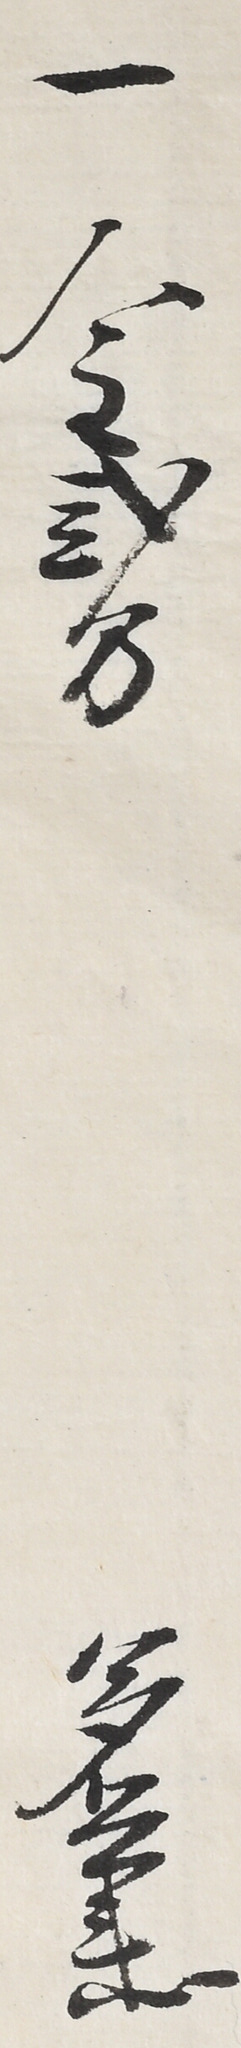一金弐分多兵衛
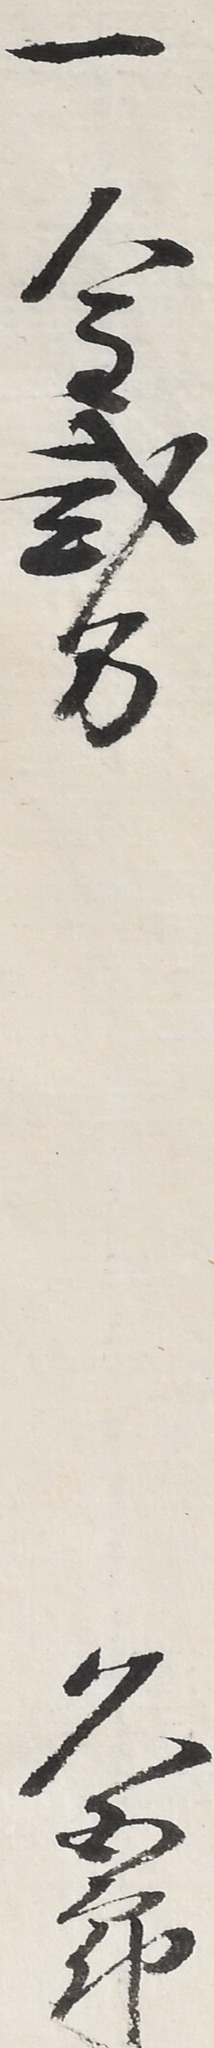一金弐分久五郎
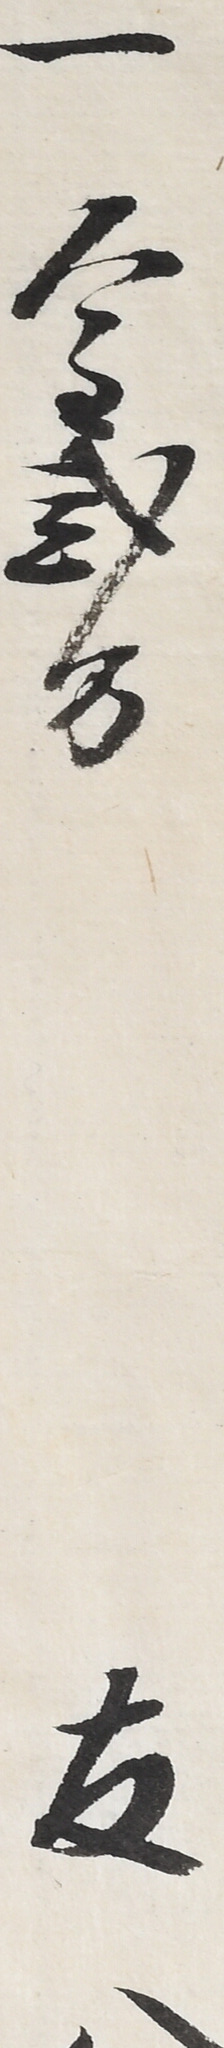一金弐分友八
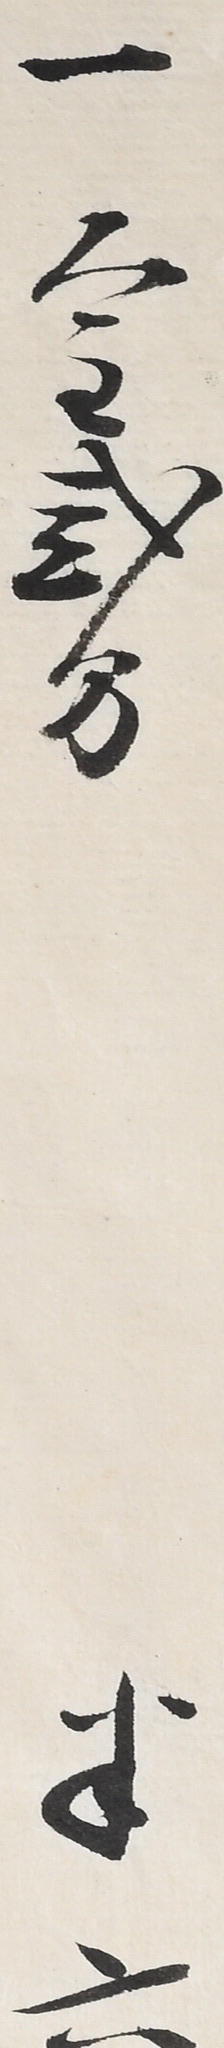一金弐分半六
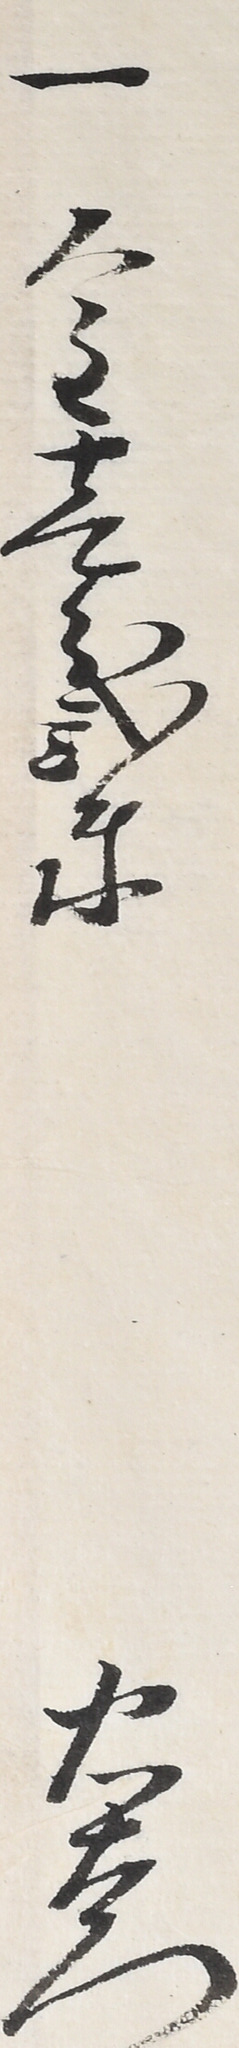一金壱分弐朱忠右衛門
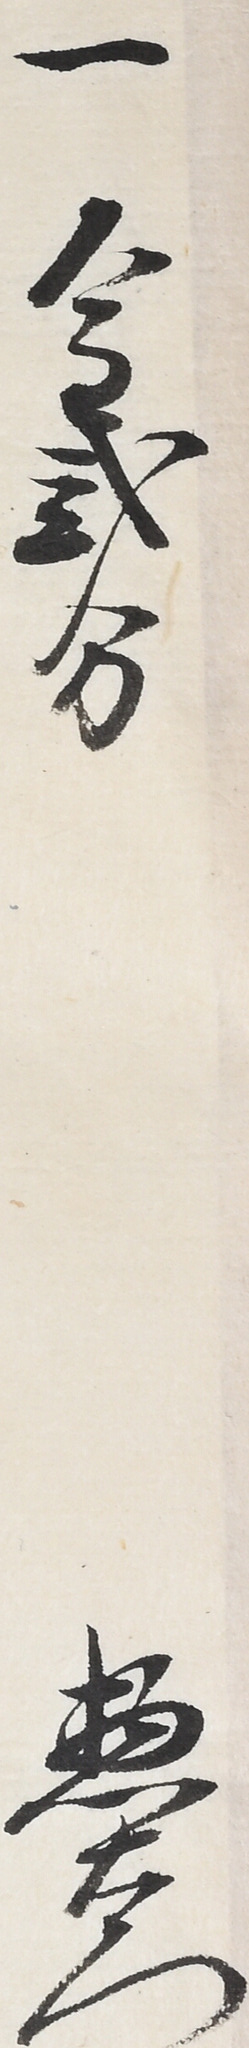一金弐分惣右衛門
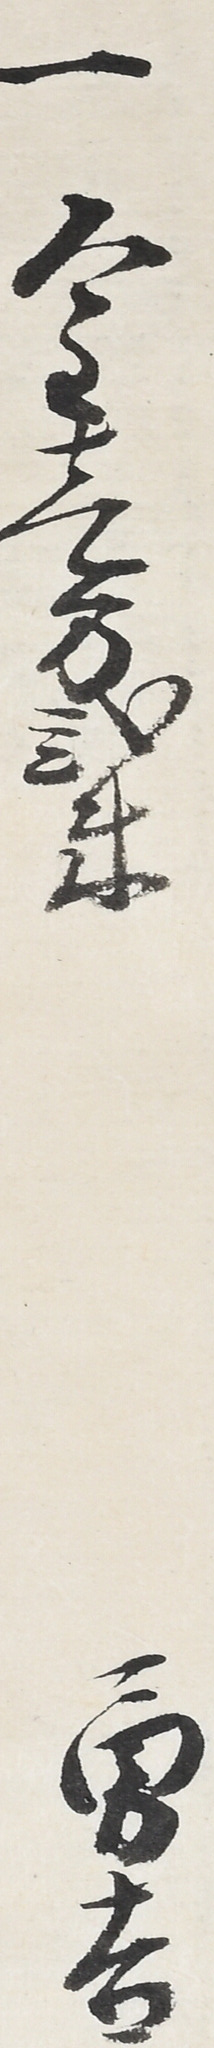一金壱分弐朱勇吉
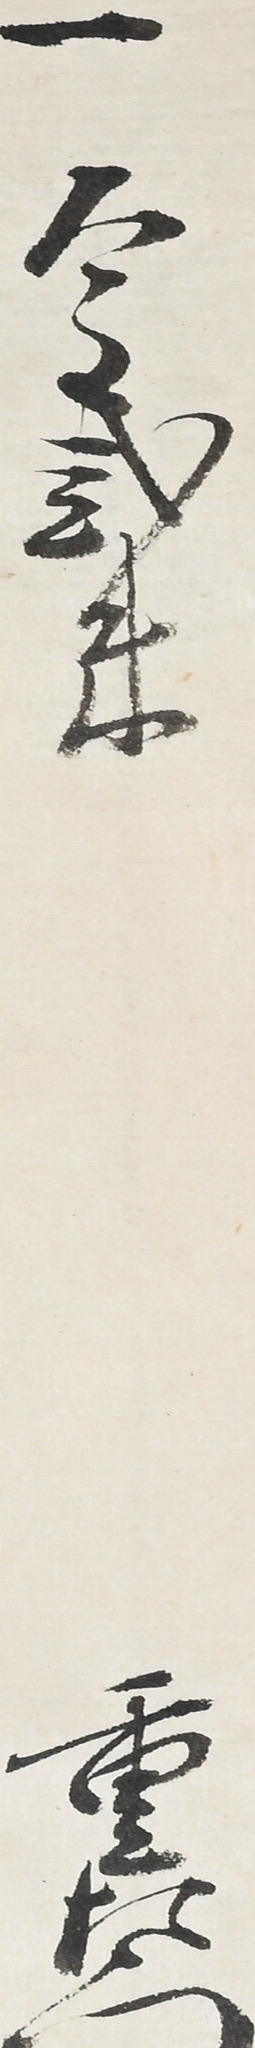一金弐朱重左衛門
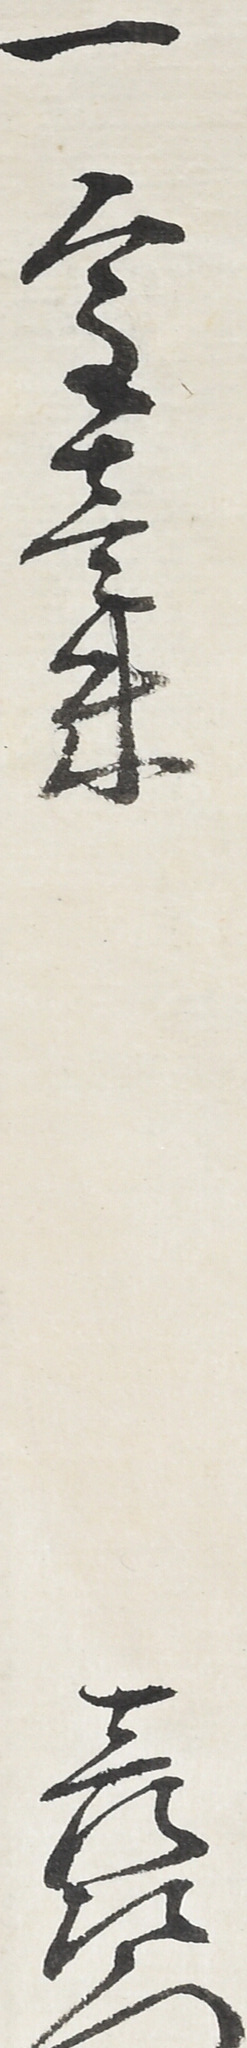一金壱朱彦左衛門
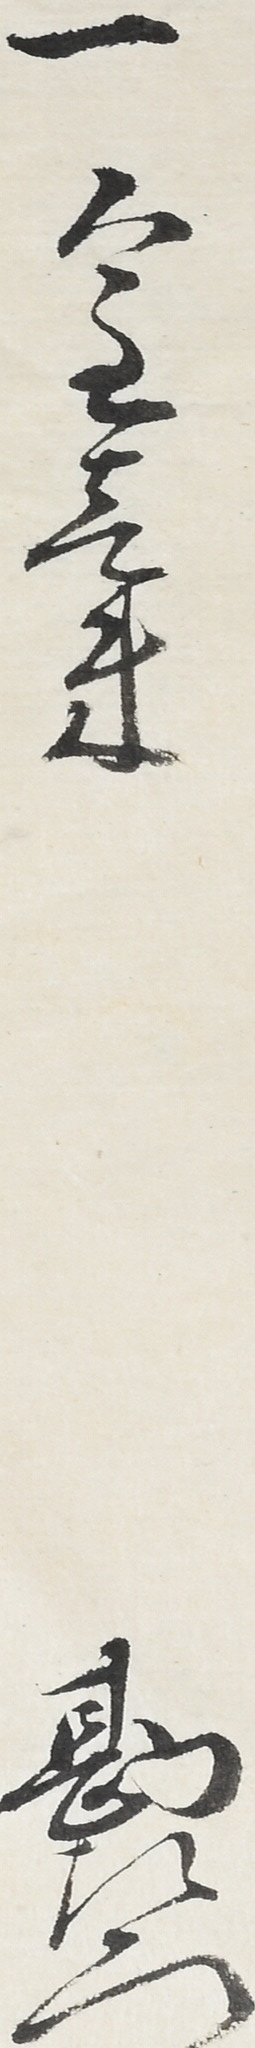一金壱朱勘左衛門

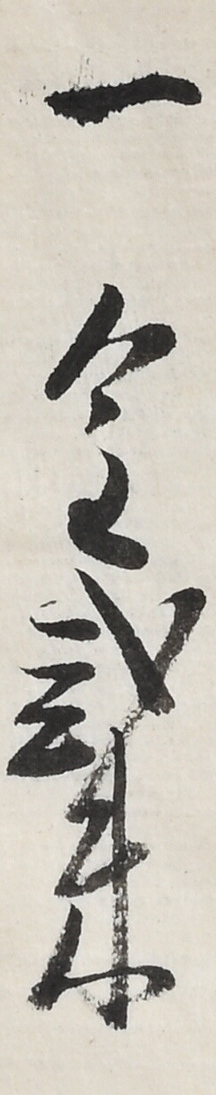一金弐朱梅蔵
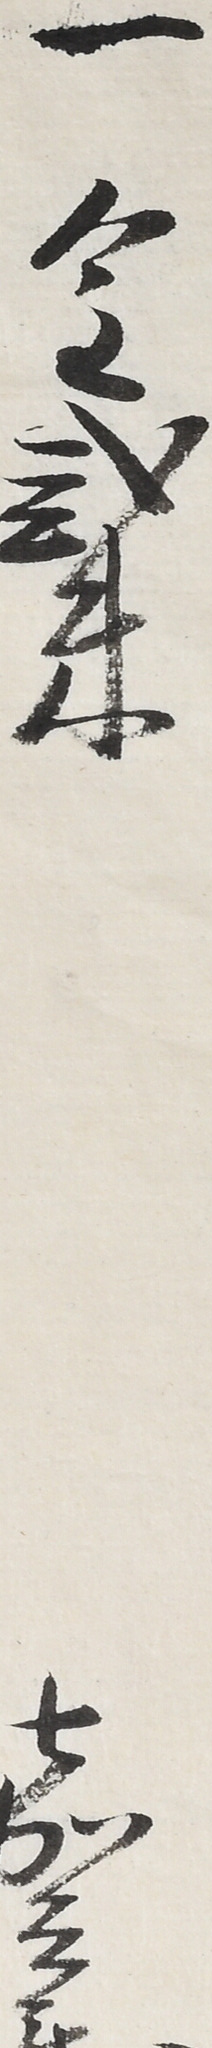一金弐朱嘉兵衛
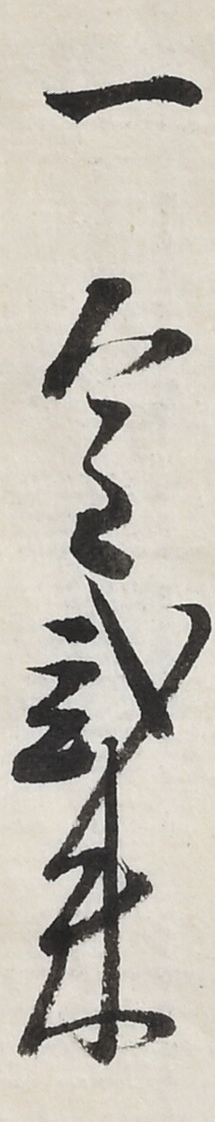一金弐朱梅蔵
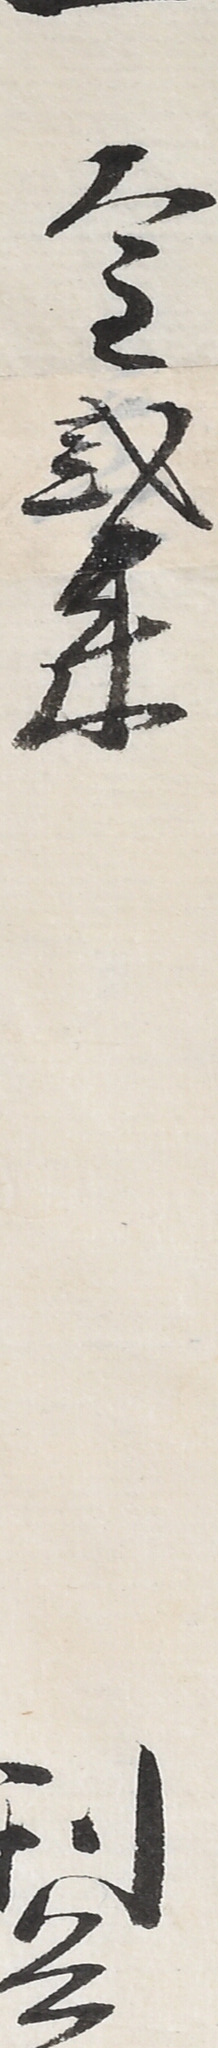一金弐朱利兵衛
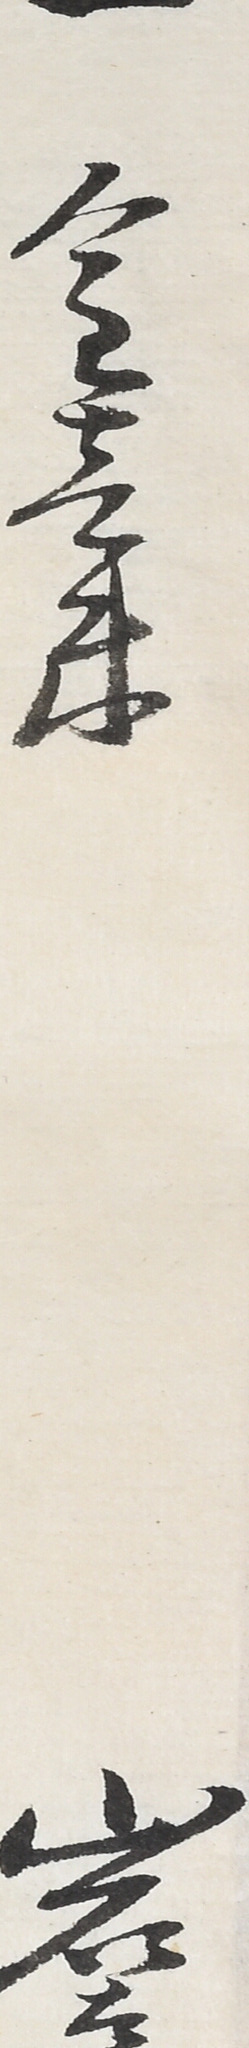一金壱朱岩太郎
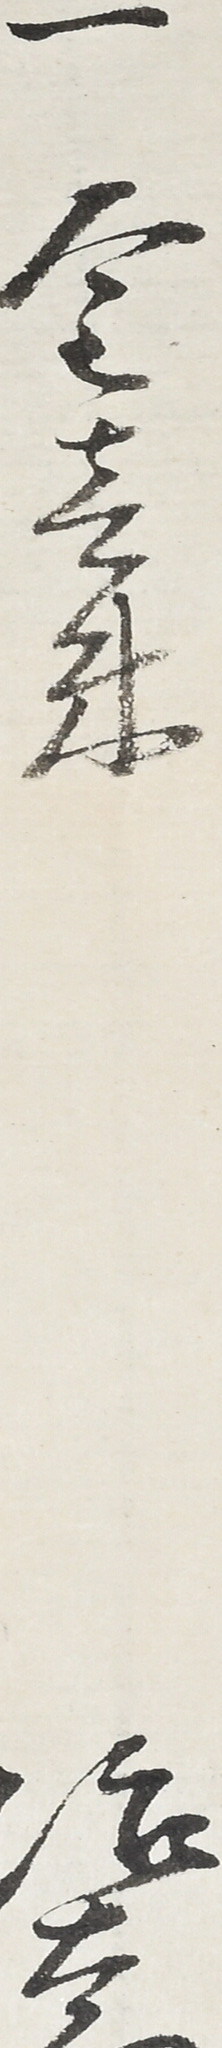一金壱朱岩太郎
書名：御拝地百五拾年御祝儀献上御目録名前
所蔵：伊那市立高遠町図書館・合同会社AMANE
